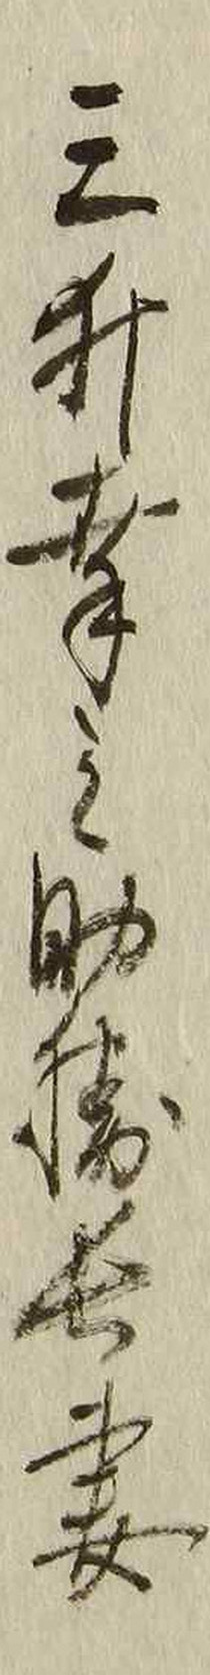女三井幸之助勝長妻
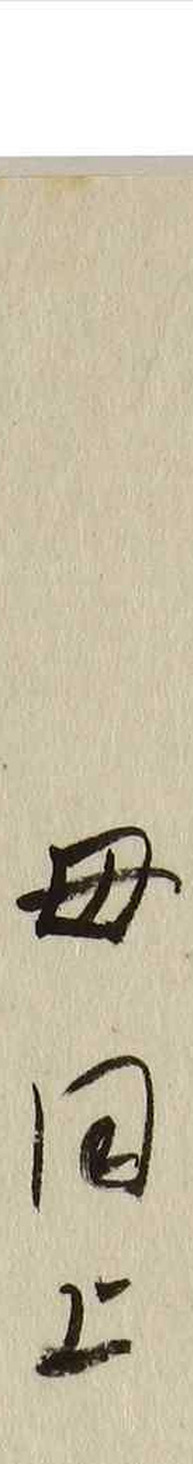母同上
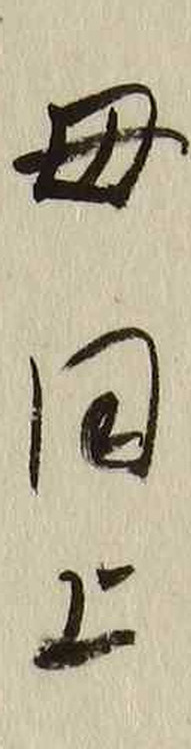母同上
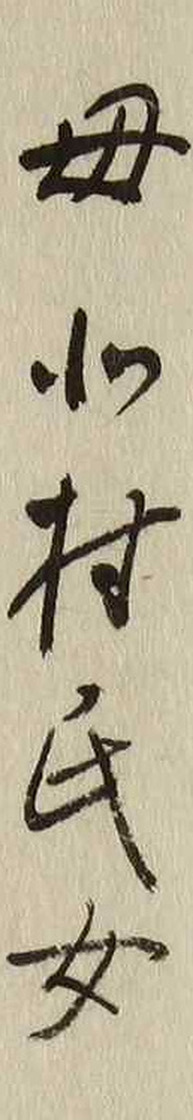母北村氏女
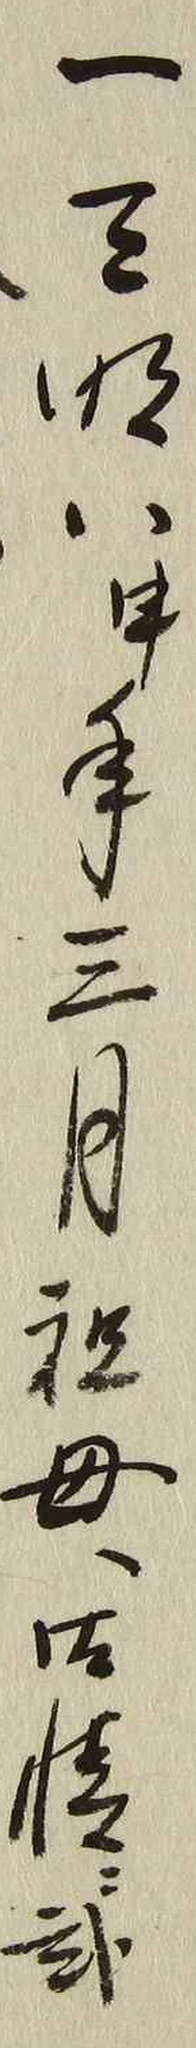一天明八申年三月祖母へ御情ニ弐
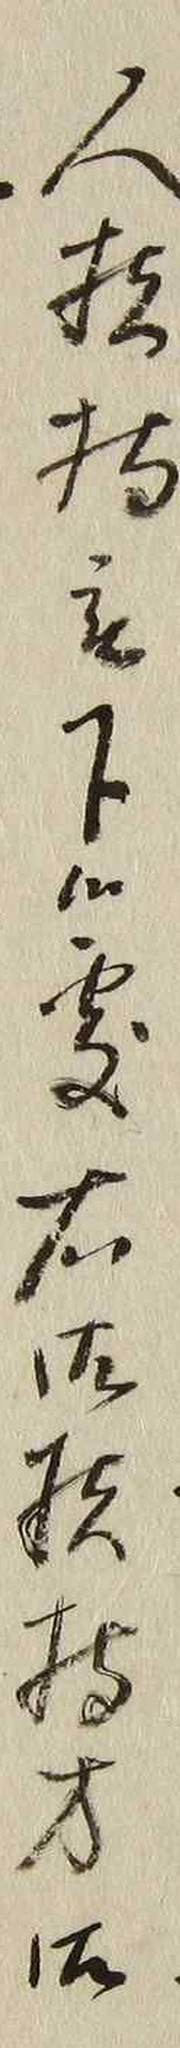人扶持被下候処右御扶持方御
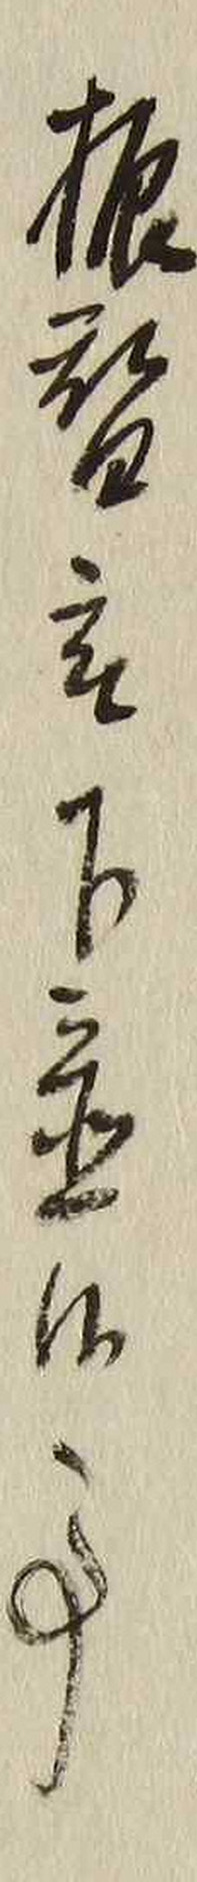振替被下置候事
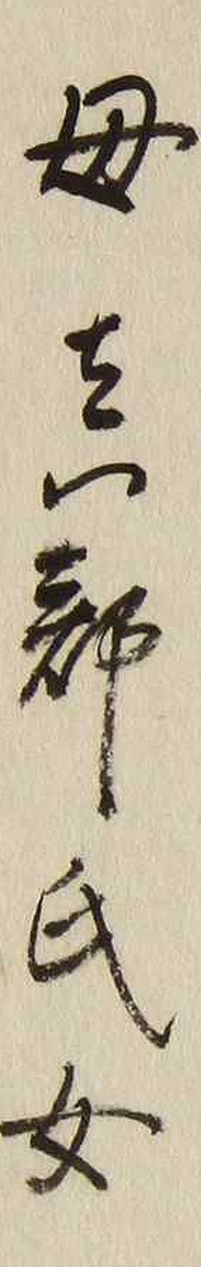母真部氏女

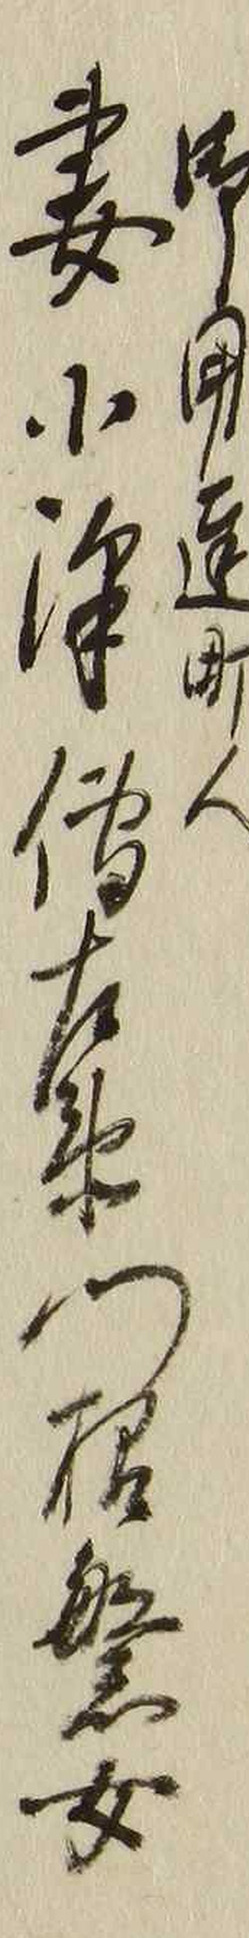妻小沢伝左衛門繁女
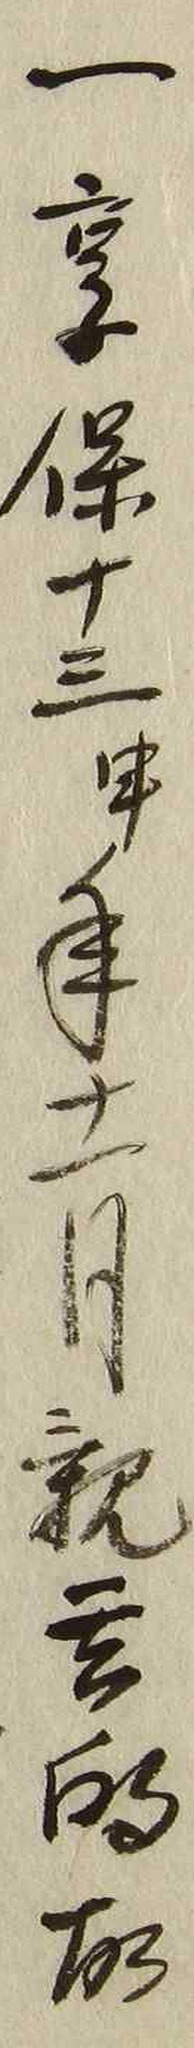一享保十三申年十一月親玄的故
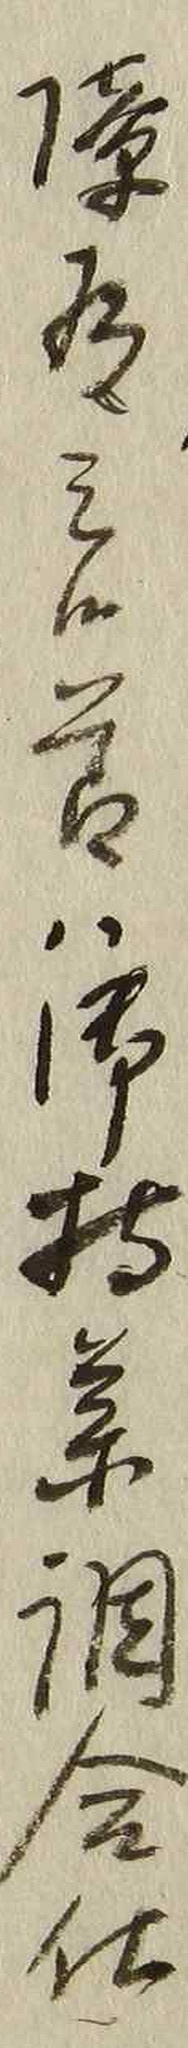障有之候節ハ御持薬調合仕
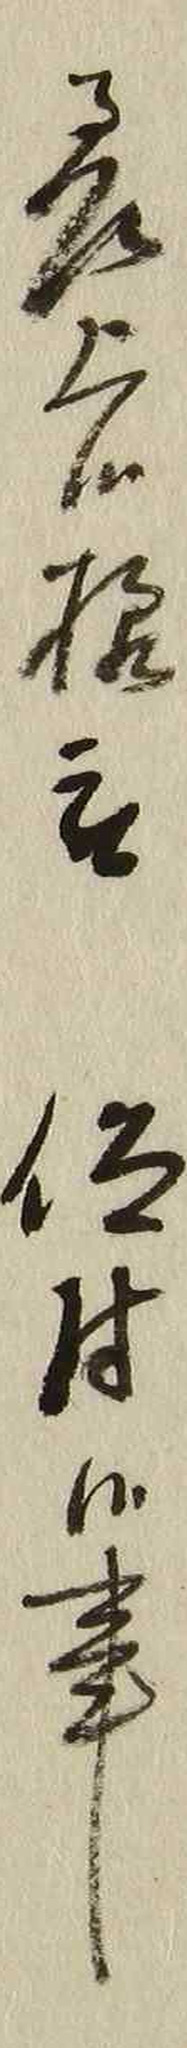差上候様被仰付候事
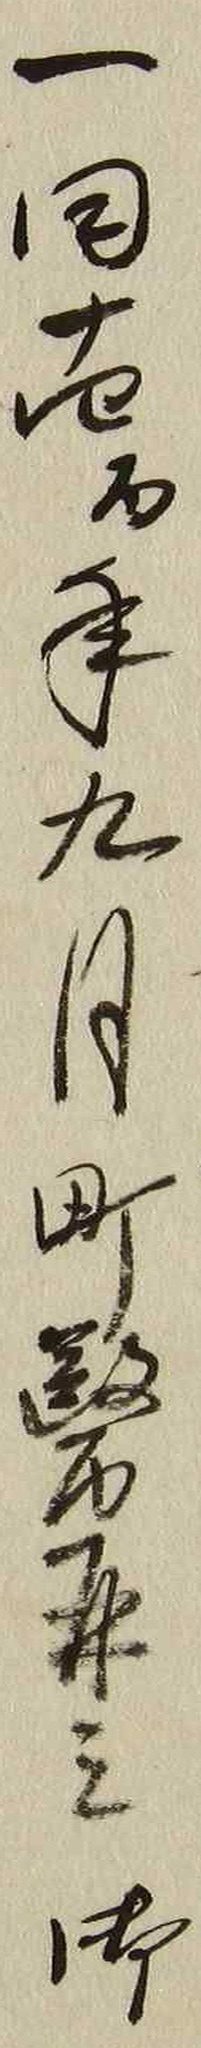一同十四酉年九月町医再之御
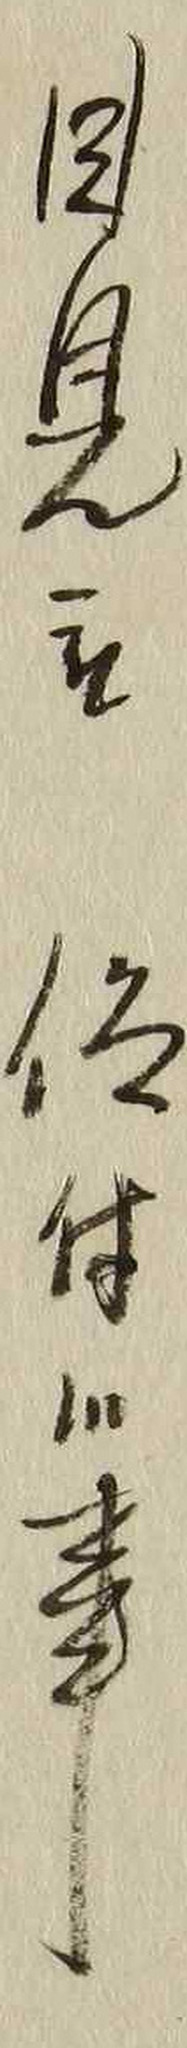目見被仰付候事
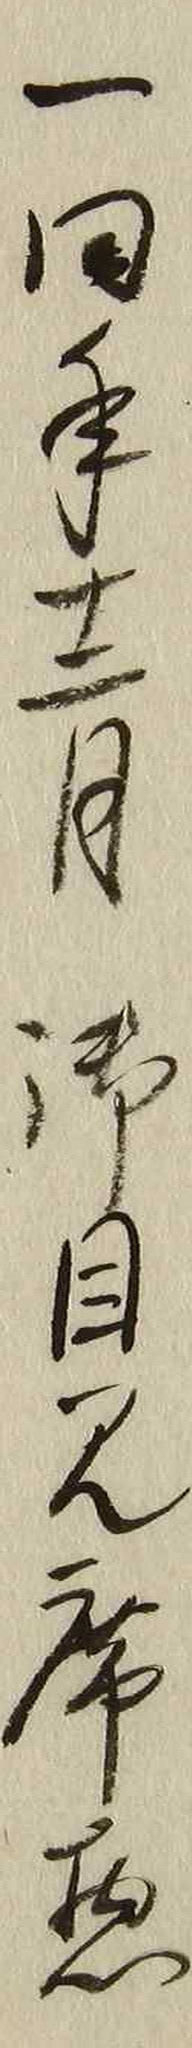一同年十二月御目見席惣
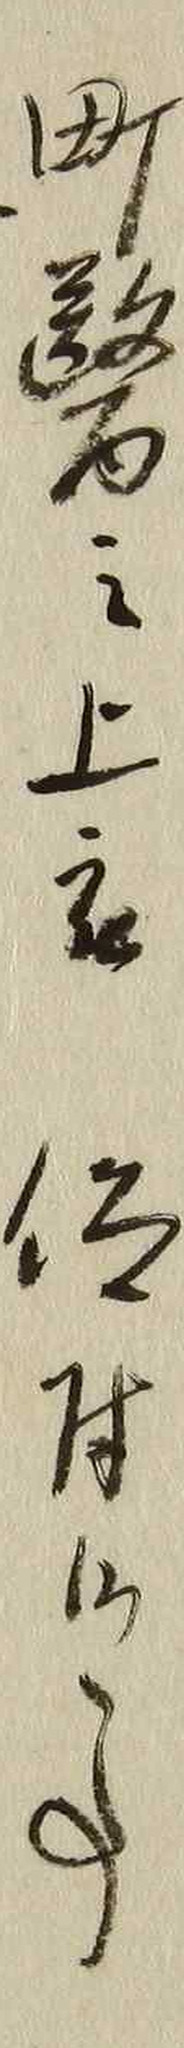町医之上被仰付候事
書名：諸士系譜　巻之353　す之部3
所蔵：会津若松市立会津図書館
